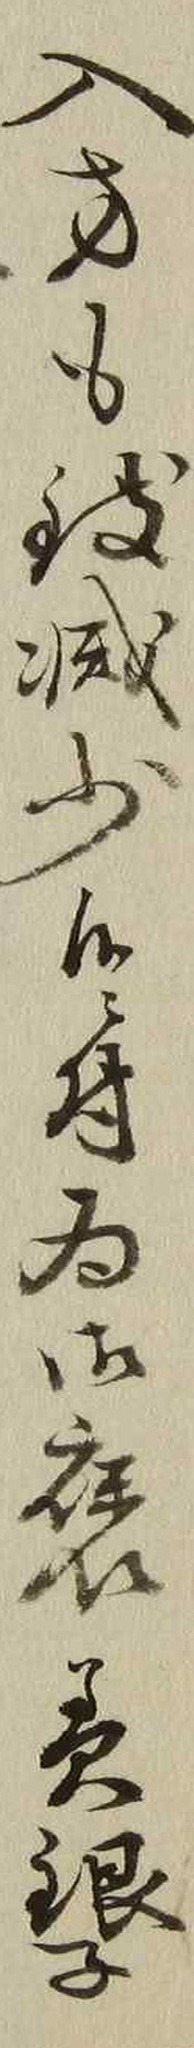入方も致減少候ニ付為御褒美銀子
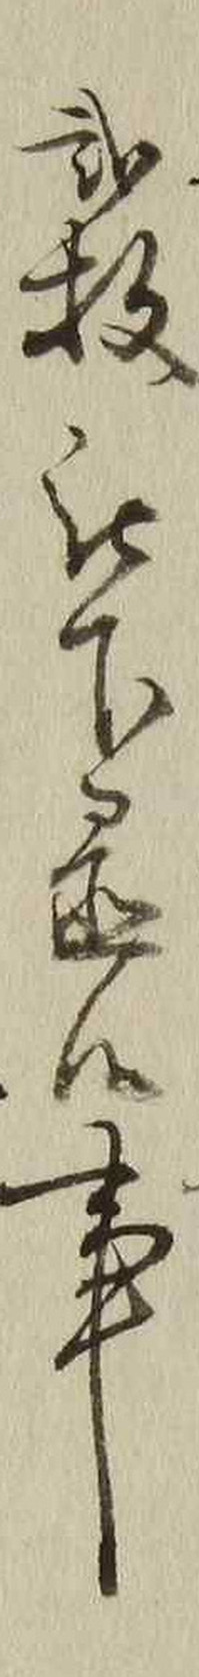弐枚被下置候事
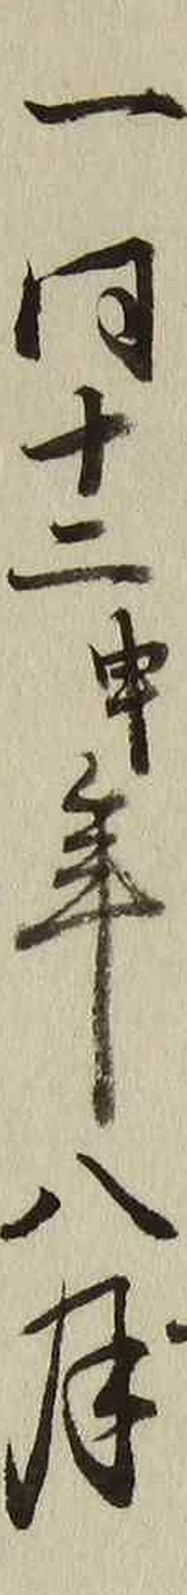一同十二申年八月
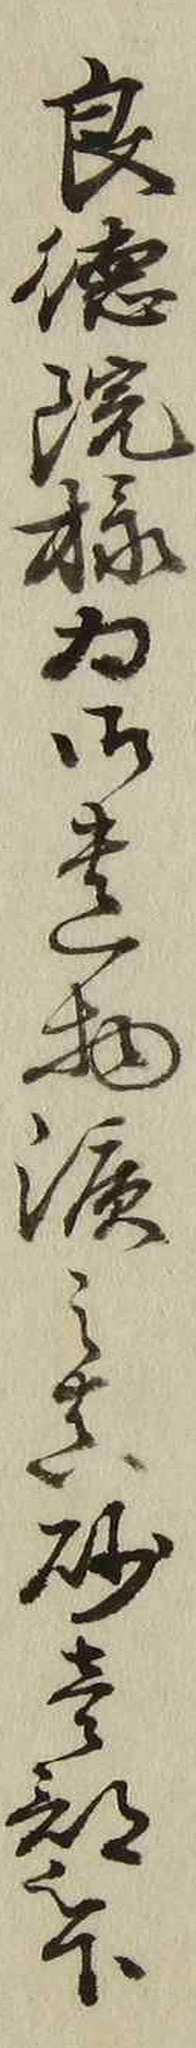良徳院様為御遺物浜之真砂壱部被下
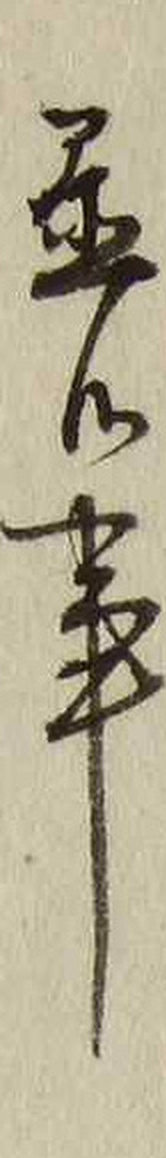置候事
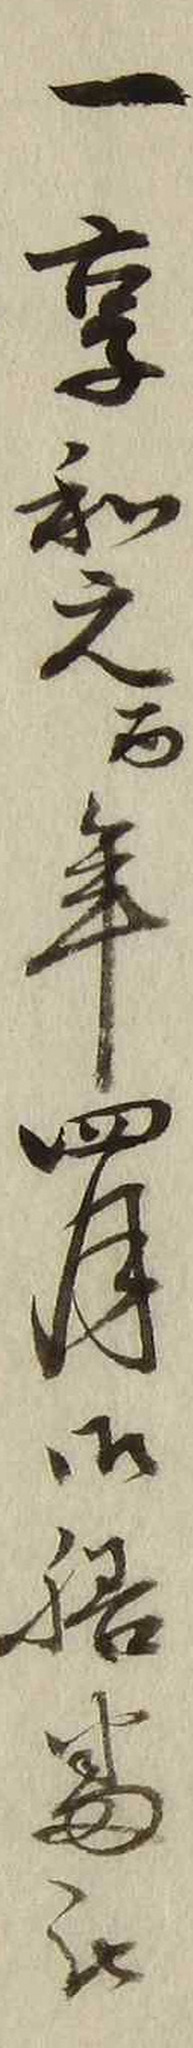一享和元酉年四月御膳番被
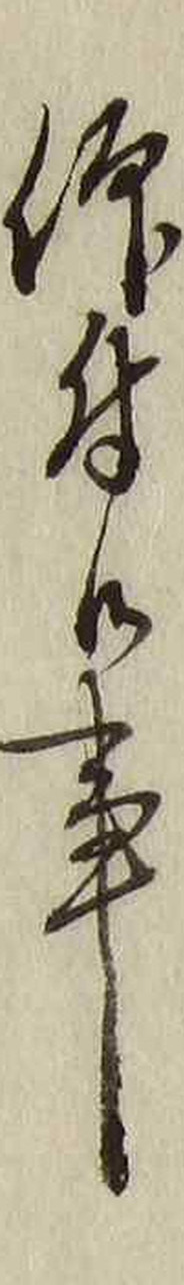仰付候事

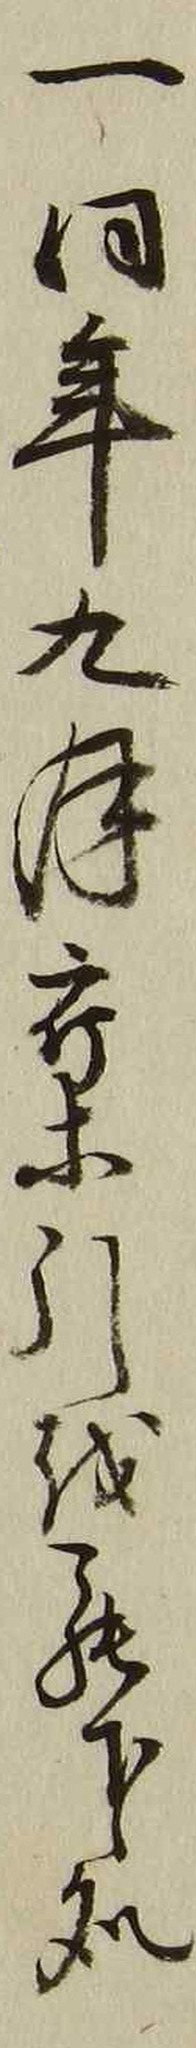一同年九月府等引越罷下候処
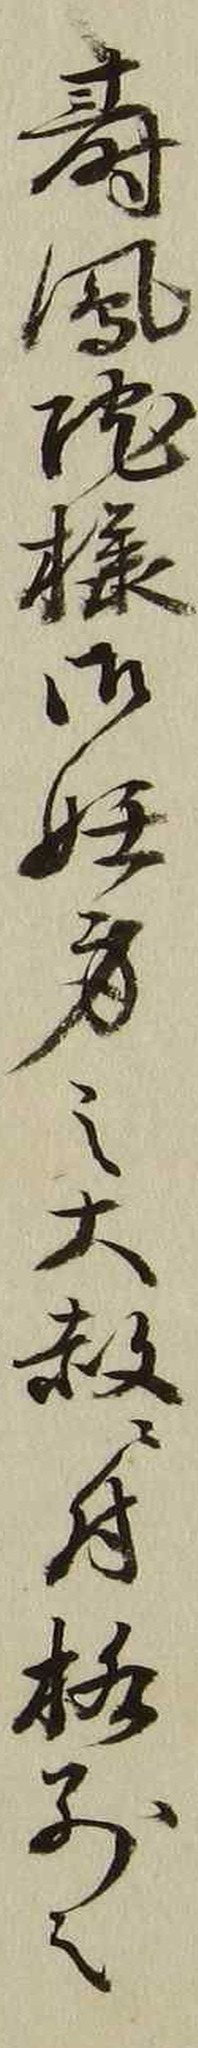寿鳳院様御妊身之大赦ニ付格別之
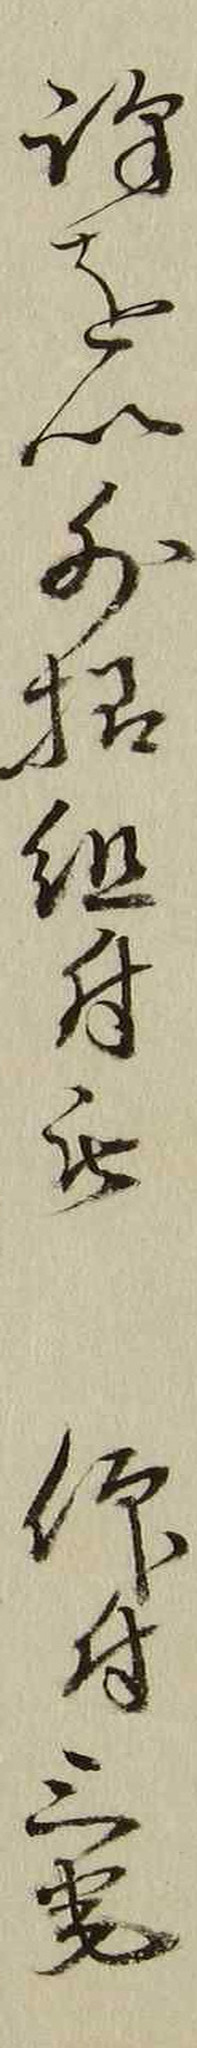訳を以外様組付被仰付三宅
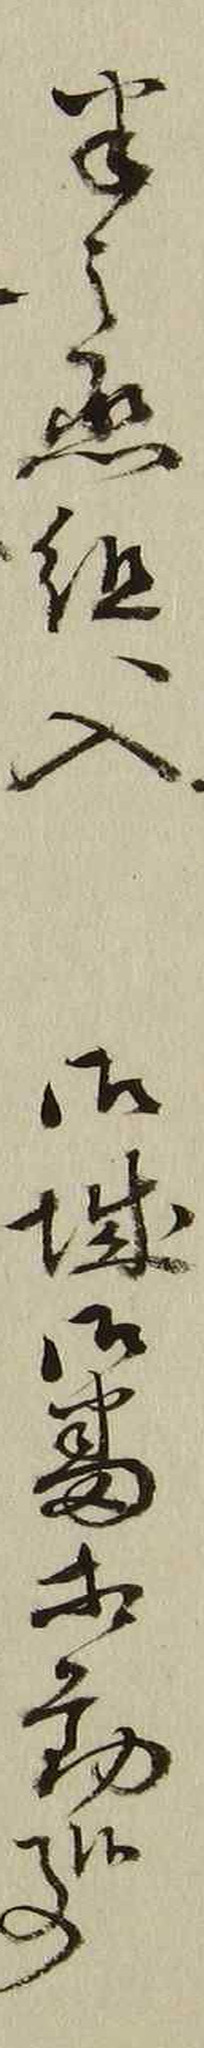半之丞組へ入御城御番相勤候事
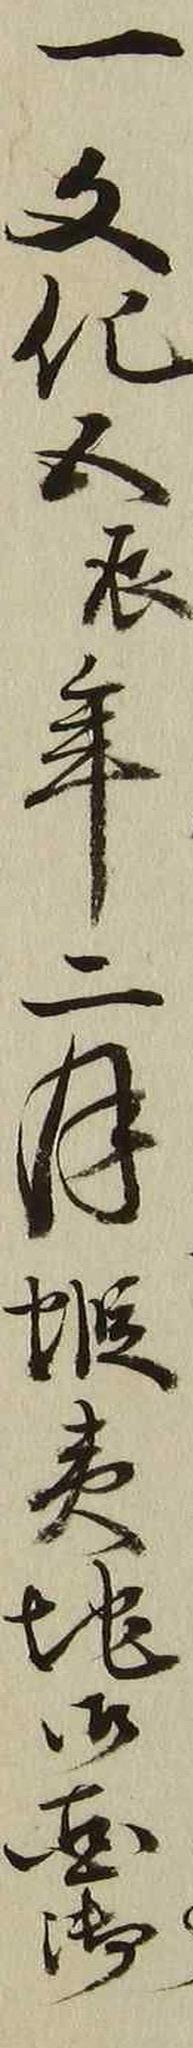一文化五辰年二月蝦夷地御固御
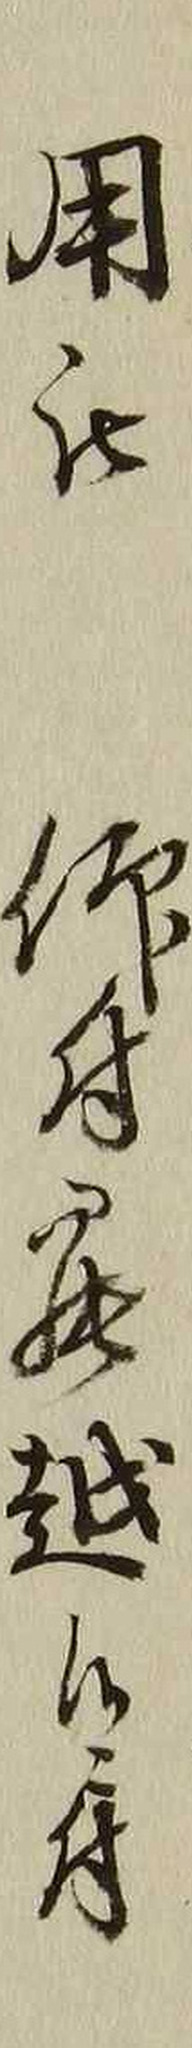用被仰付罷越候ニ付
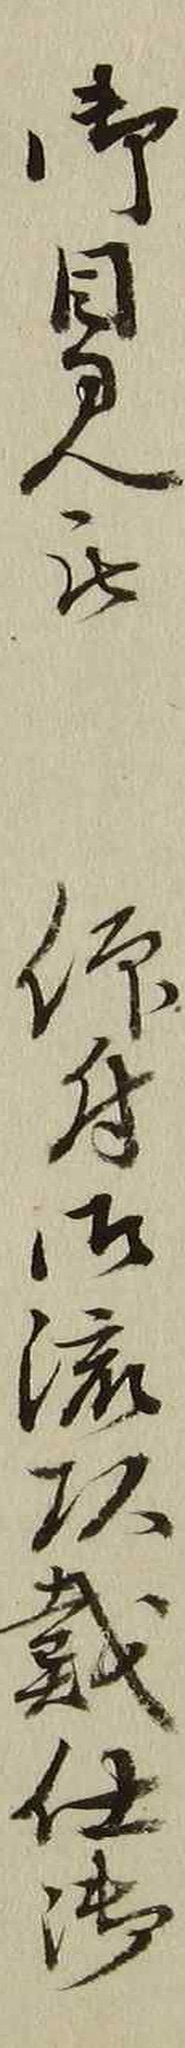御目見被仰付御流頂戴仕御
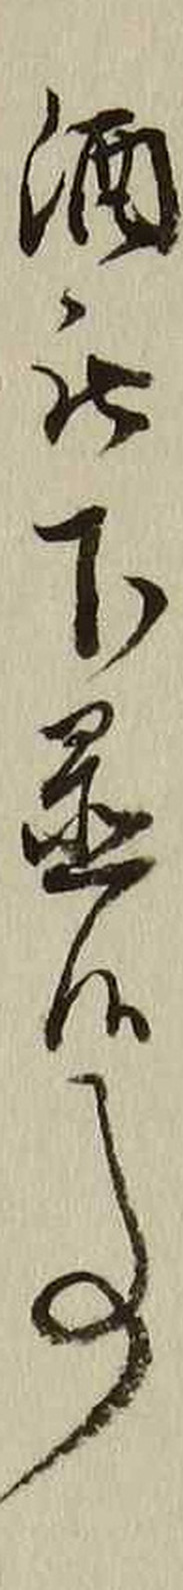酒被下置候事
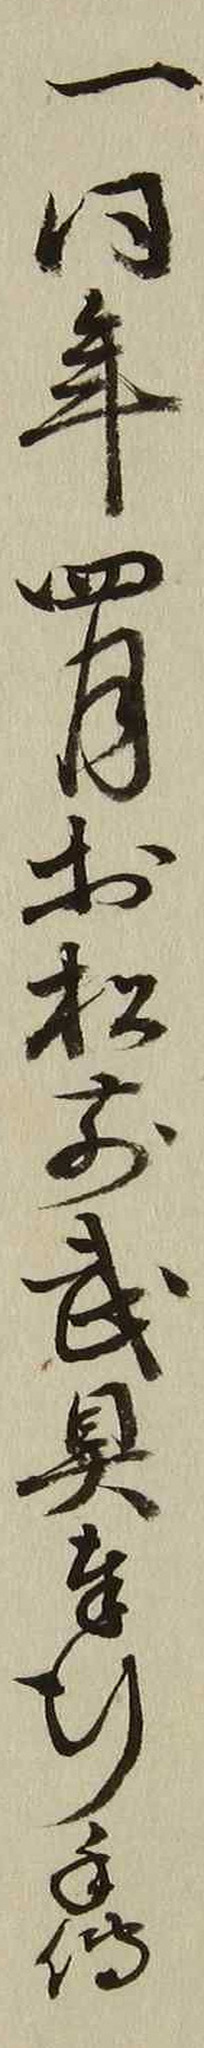一同年四月於松前武具奉行手伝
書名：諸士系譜　巻之35　は之部3
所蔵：会津若松市立会津図書館
